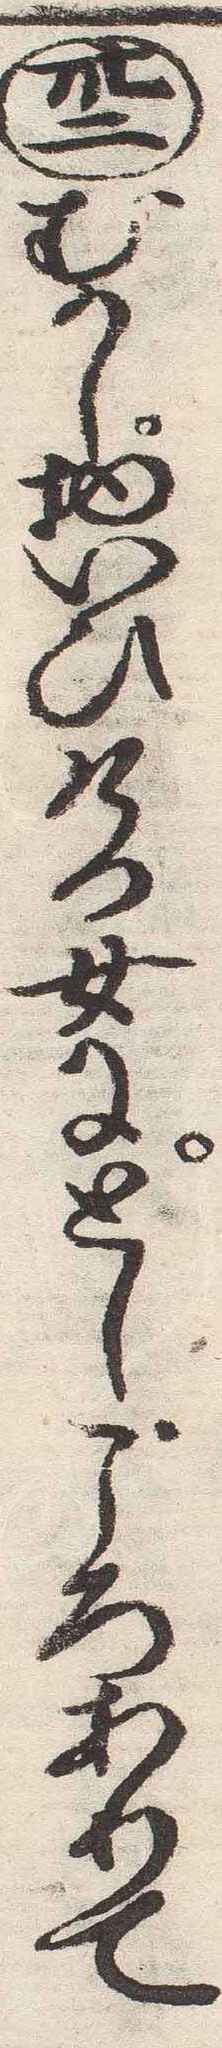卅二むかし。物いひける女に。としごろありて
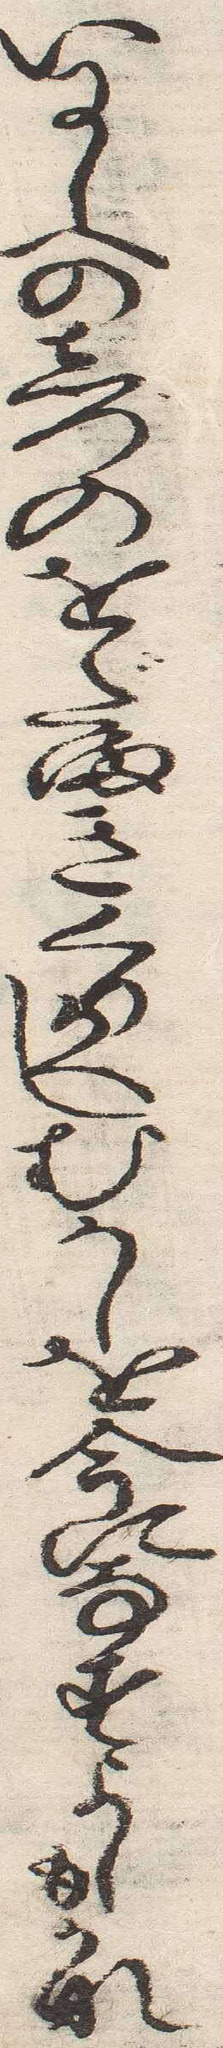いにしへのしつのをだまきくりかへしむかしを今になすよしもかな
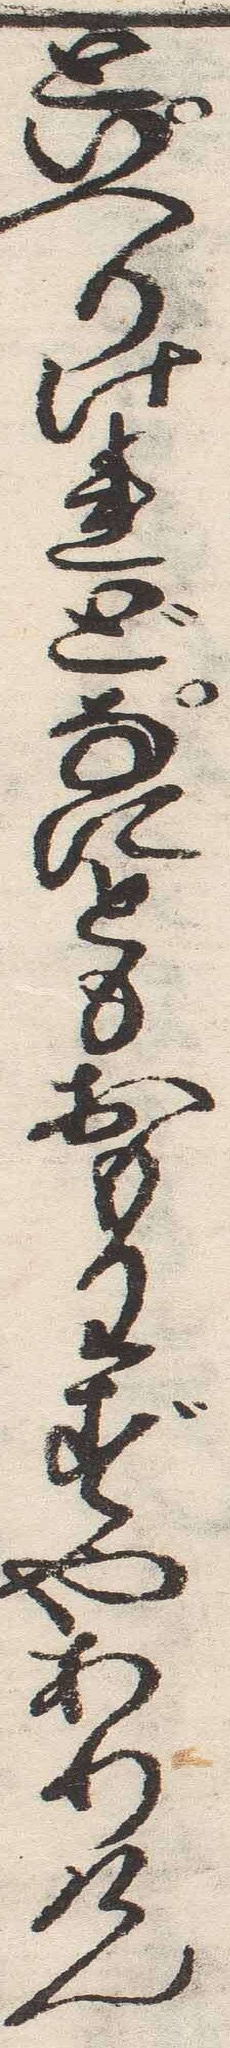と。いへりけれど。なにともおもわずやありけん
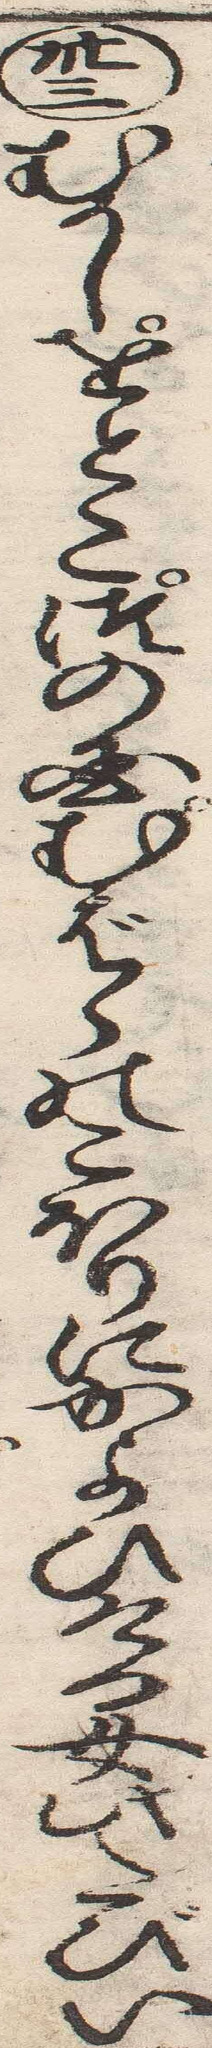卅三むかし。をとこ。つの国。むばらのこほりにかよひける女此たびい
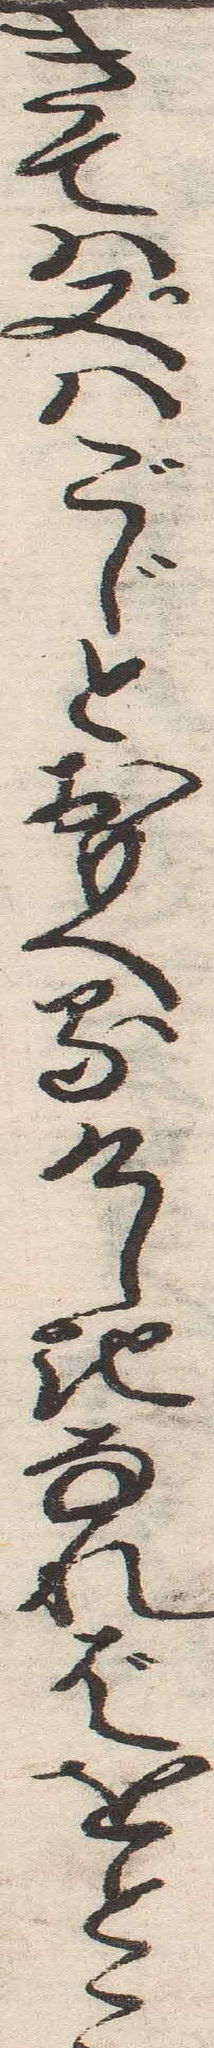きては。又はごじとおもへるけしきなれば。をとこ
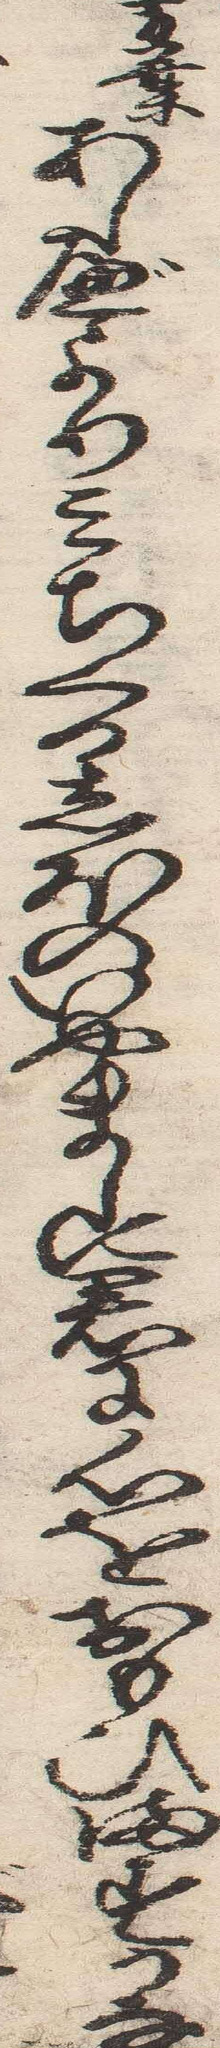万葉あしべよりみちくるしほのいやましに君に心をおもひますかな
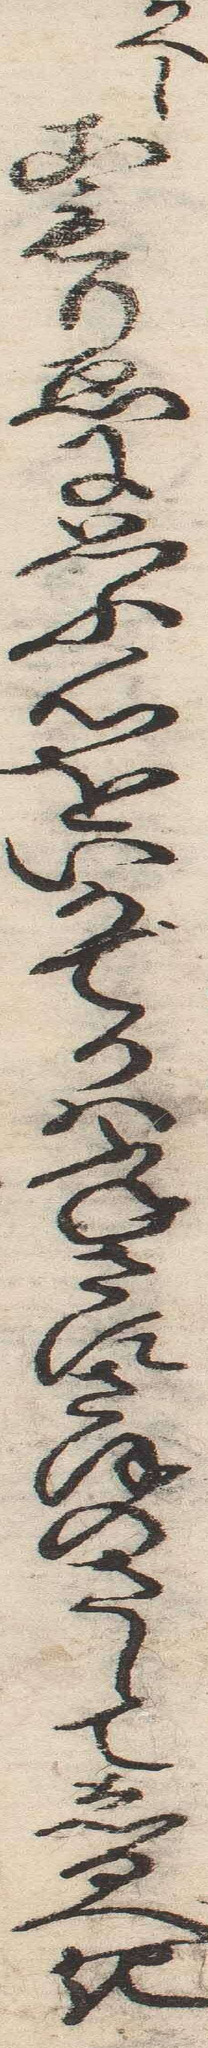こもりゑに思ふ心をいかでかはふねさすさほのさしてしるべき
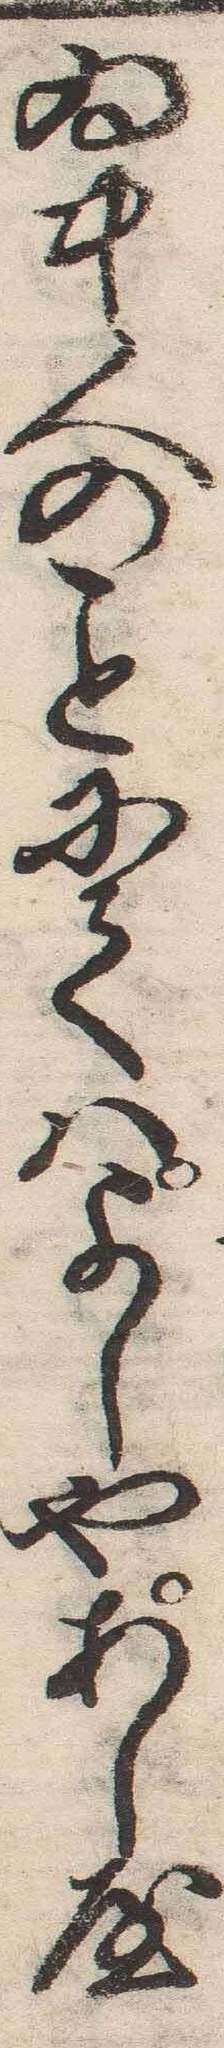ゐ中人のことにては。よしや。あしや。

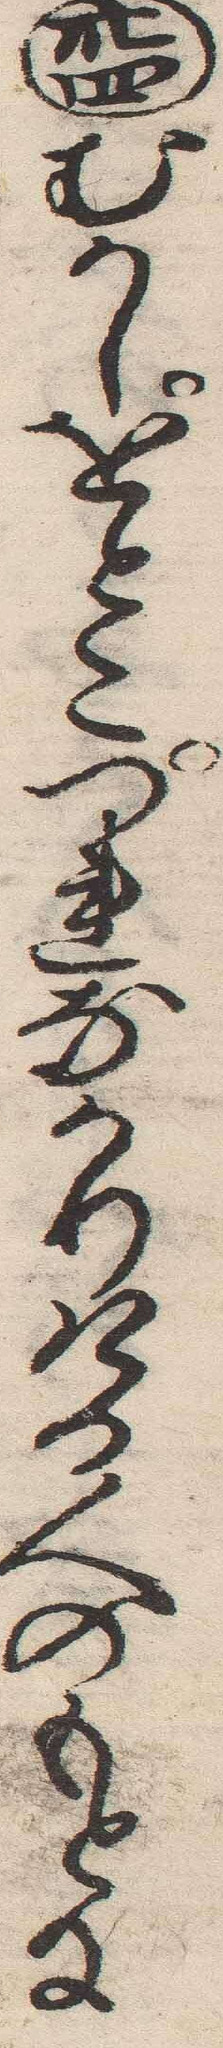卅四むかし。をとこ。つれなかりける人のもとに
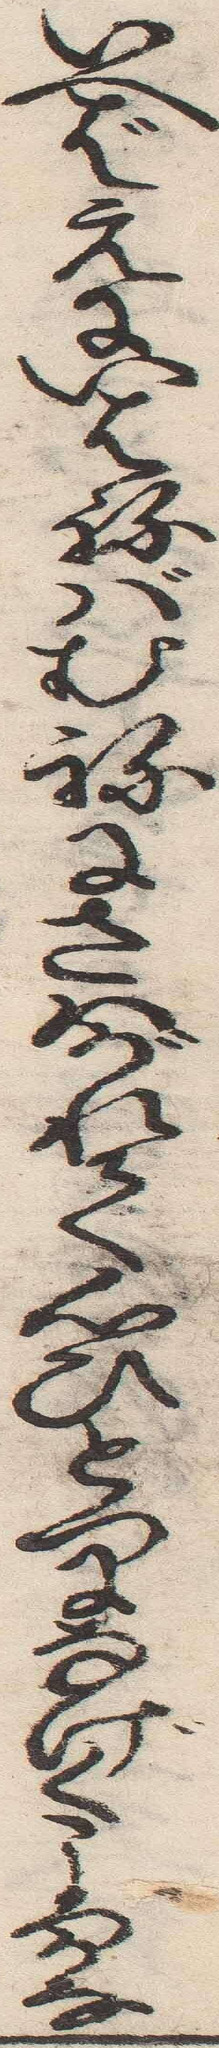いへばえにいはねばむねにさはがれて心ひとつになげくころかな
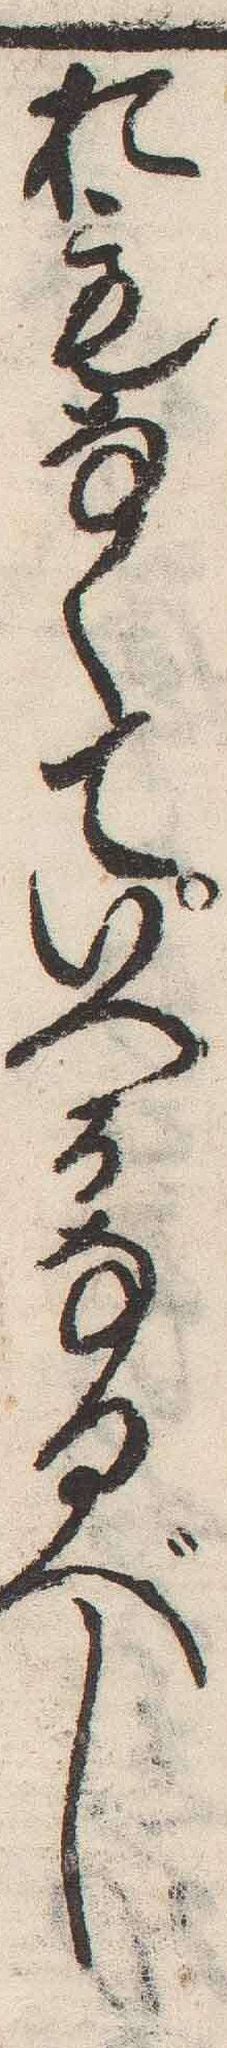おもなくて。いへるなるべし
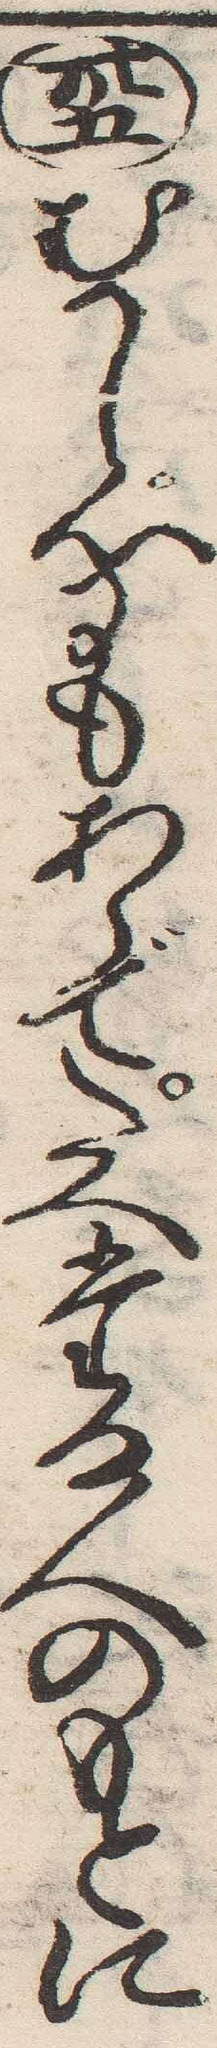卅五むかし。心にもあらで。たへたる人のもとに
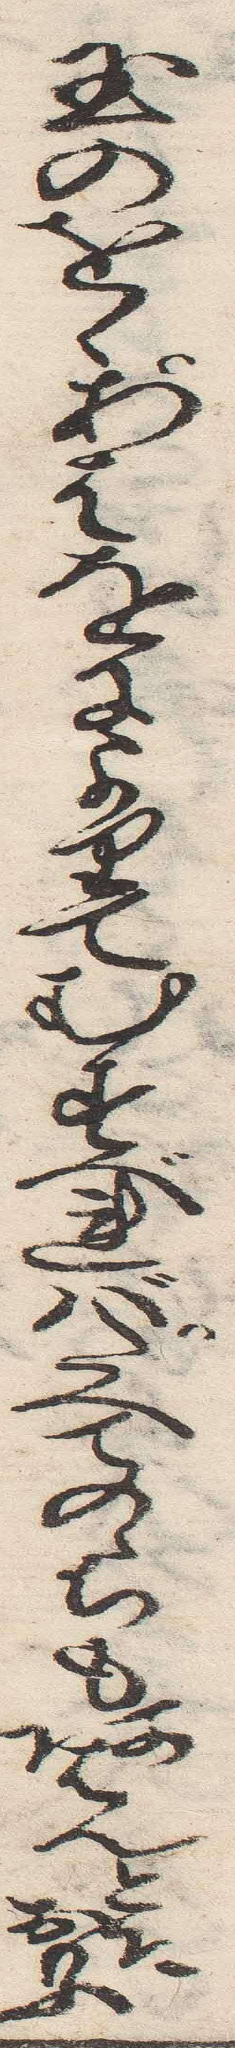玉のをゝ。あはをによりてむすべれば。たへてのゝちもあはんとそおもふ
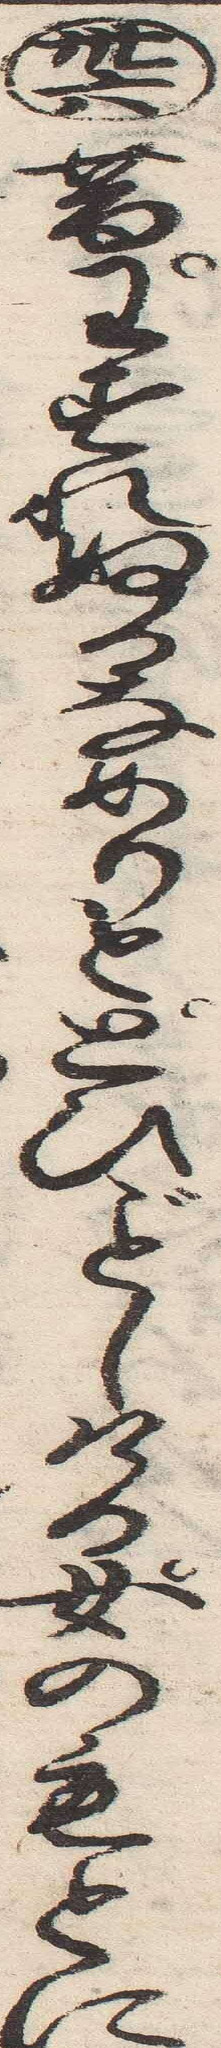卅六昔。わすれぬるなめりと。とひごとしける。女のもとに
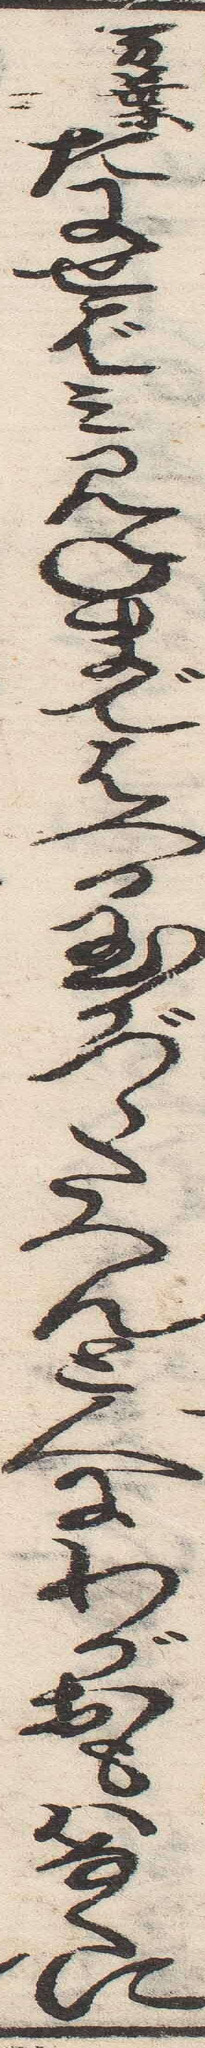万葉たにせばみみねまではへる玉かづらたへんと人にわがおもはなくに
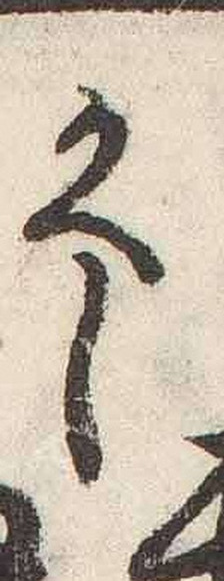かへし
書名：伊勢物語
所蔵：東京学芸大学附属図書館 国文学研究資料館
